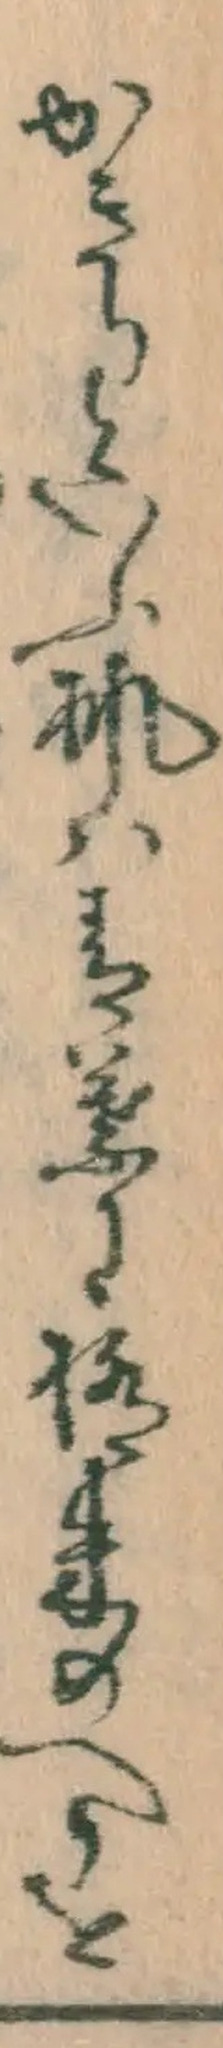松かえかきりといふ楓は青葉に極朱のへりを
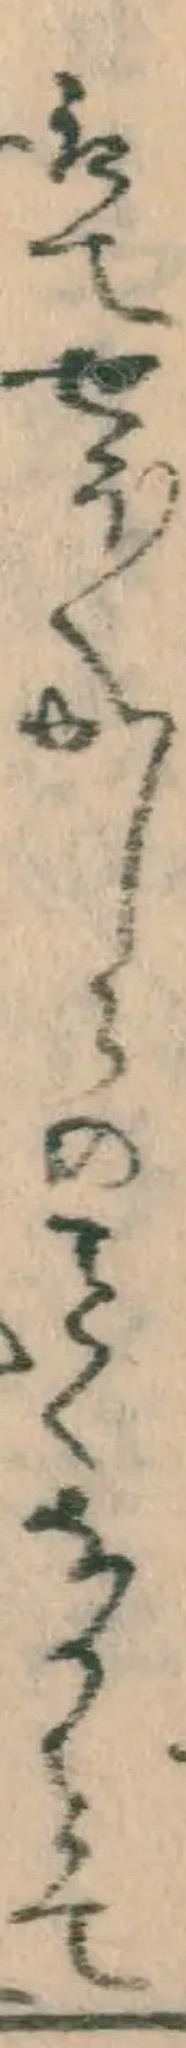取てせう〳〵かしらのことくなりとて
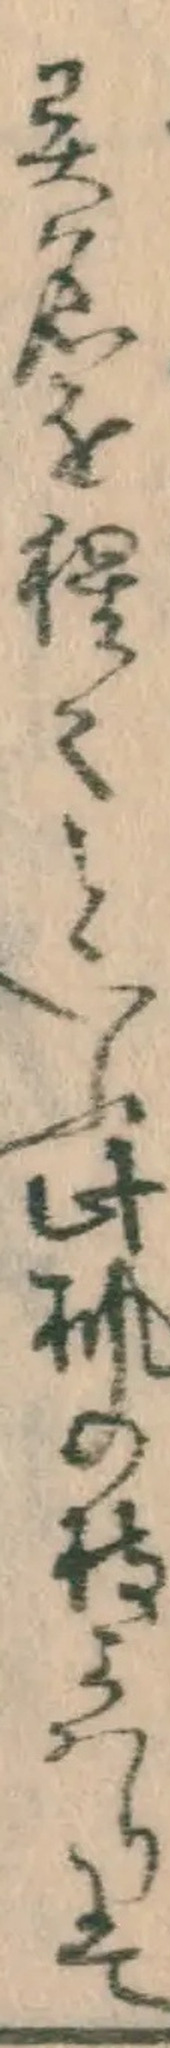異名を猩々といふ此楓の枝まはりにて
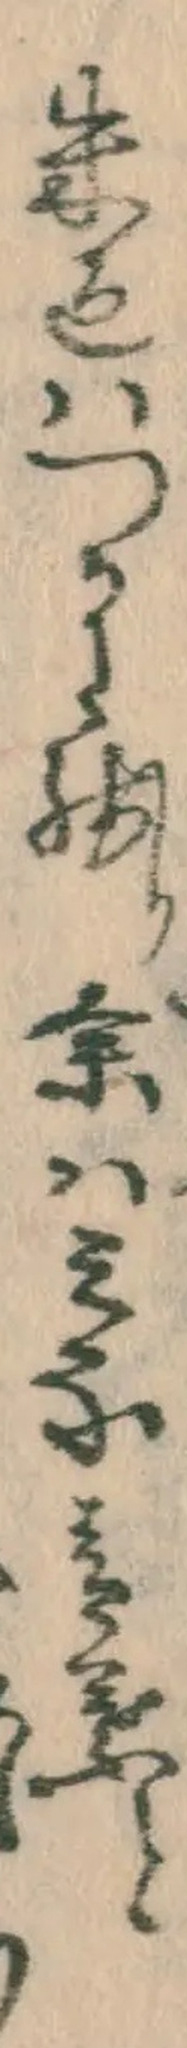朱色はつかに残り余はみな青葉と
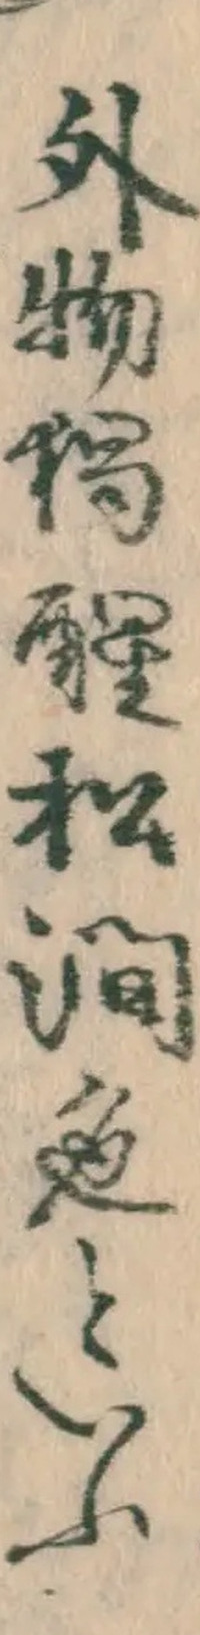外物独醒松潤色といふ
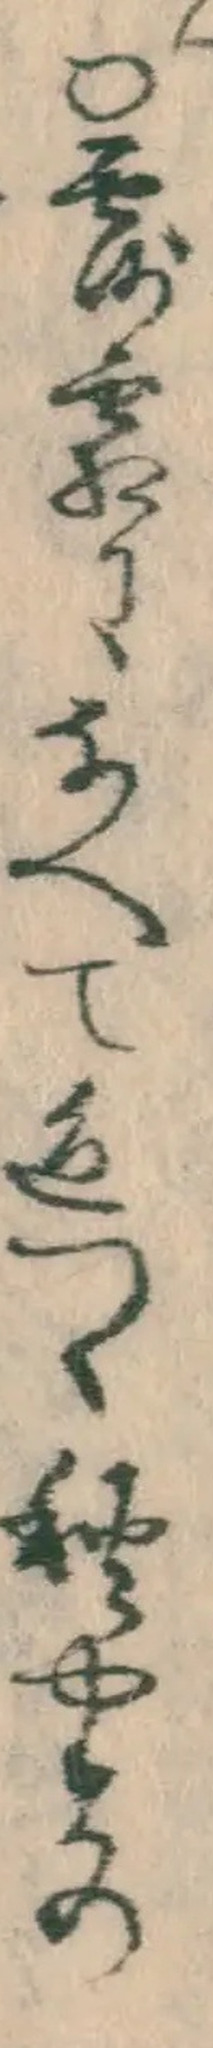○露霜になへて色つく秋やまの
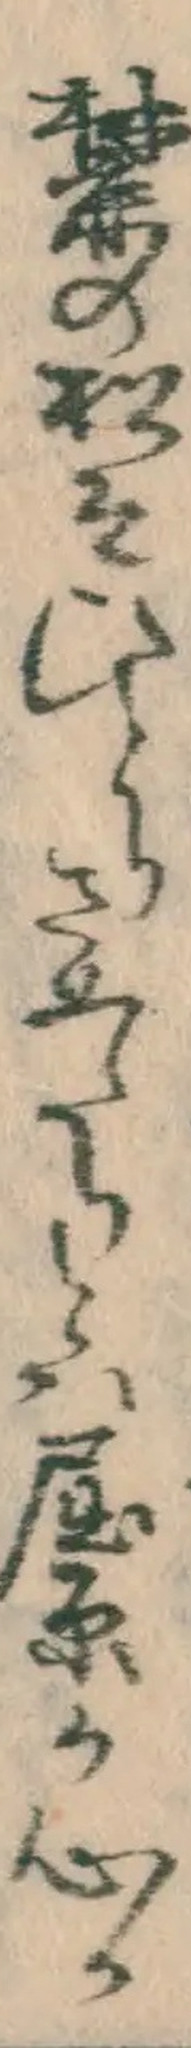麓の松そひとりさめたりとは屈原か心か
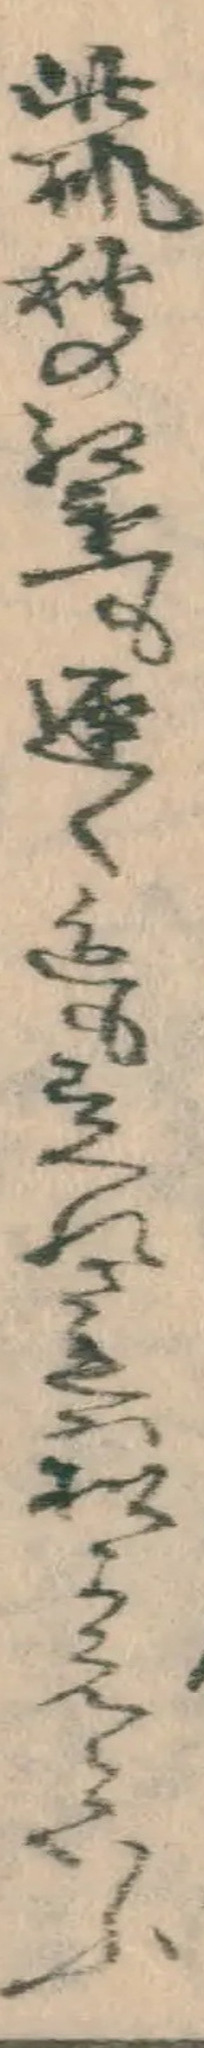此楓秋の紅葉も遅く色もすくれされは松かえといふ
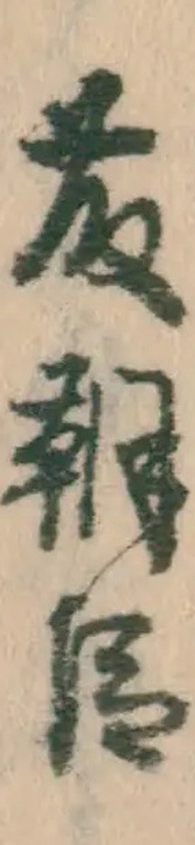藤朝臣
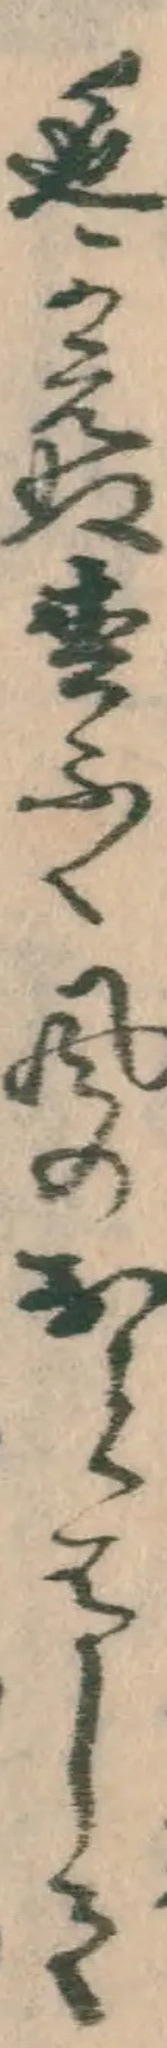色かえぬ松ふく風のおとはして
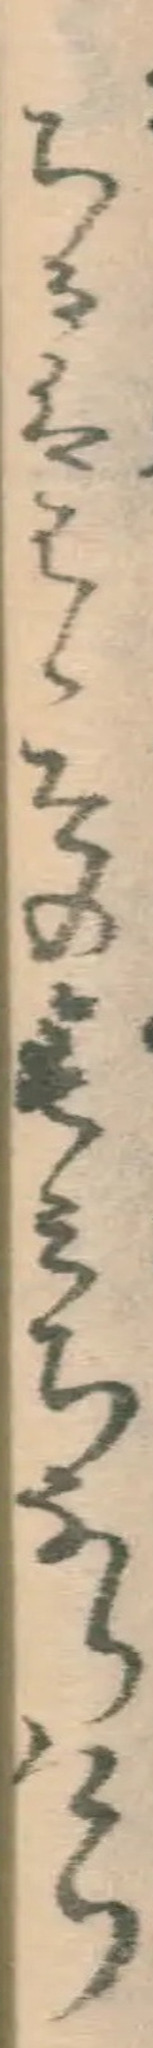ちるははゝそのもみちなりけり
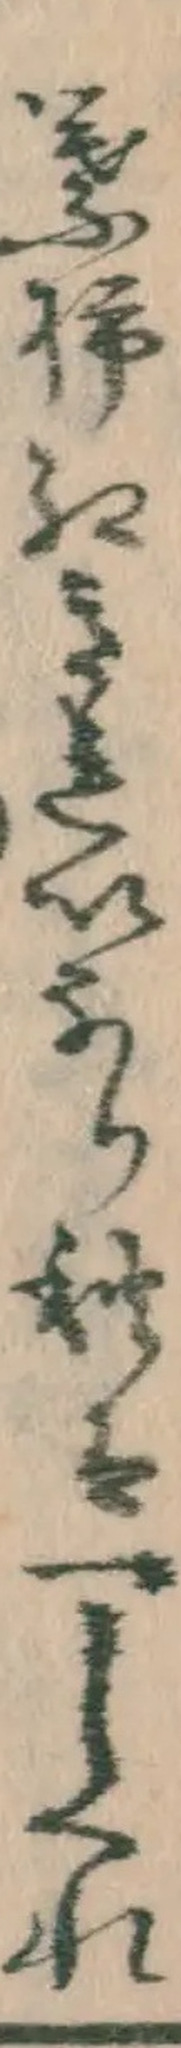葉柿紅きれいなり秋は一しくれ
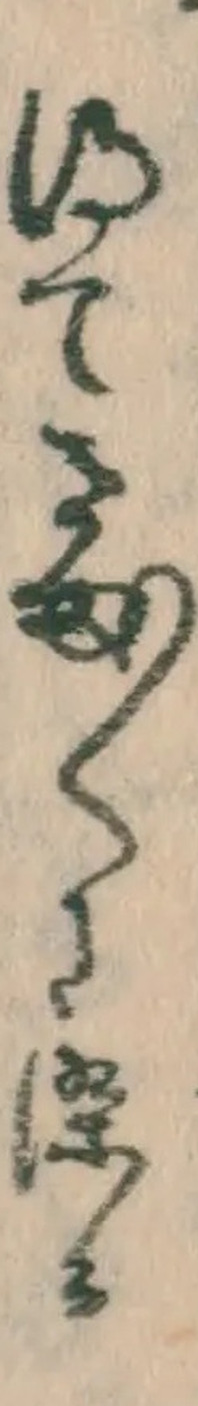得てさま〳〵に染る
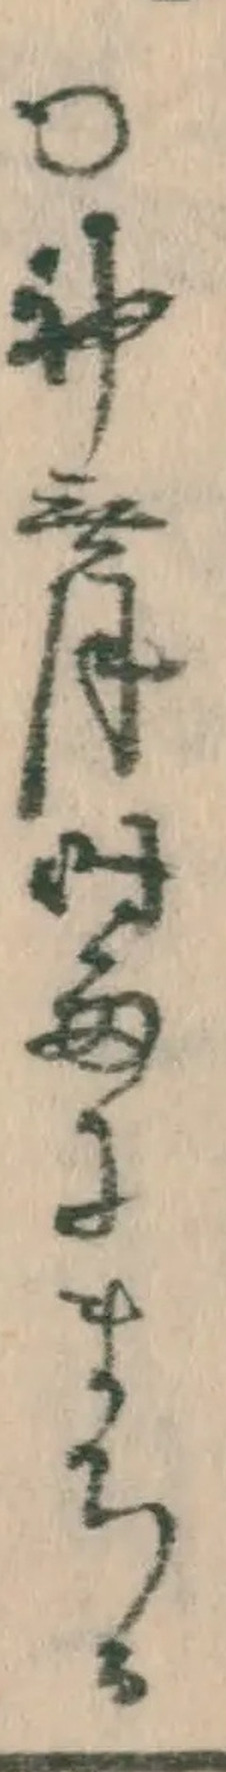○神無月時雨にまちる
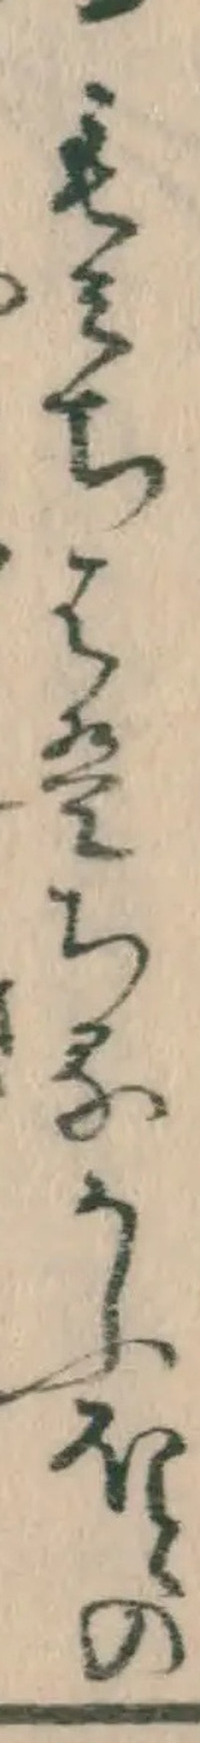もみちははちるかふほとの
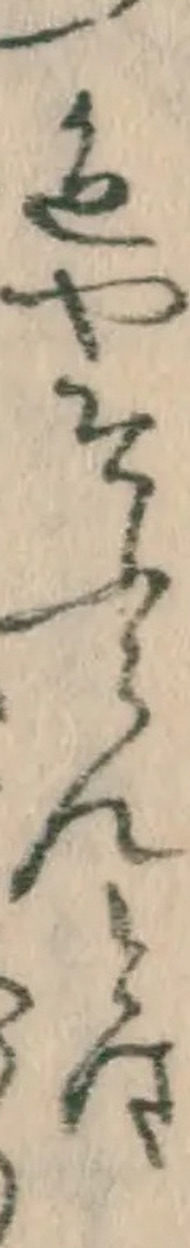色やそふらんとは
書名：紅葉集
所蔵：国立国会図書館 National Diet Library, JAPAN
